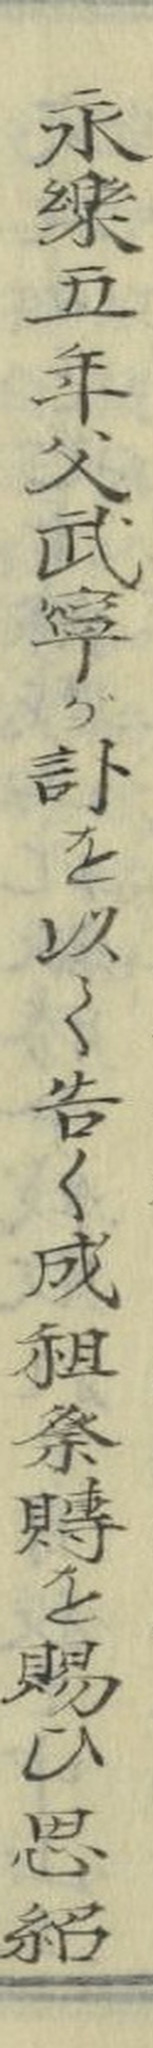永楽五年父武寧が訃を以て告く成祖祭賻を賜ひ思紹
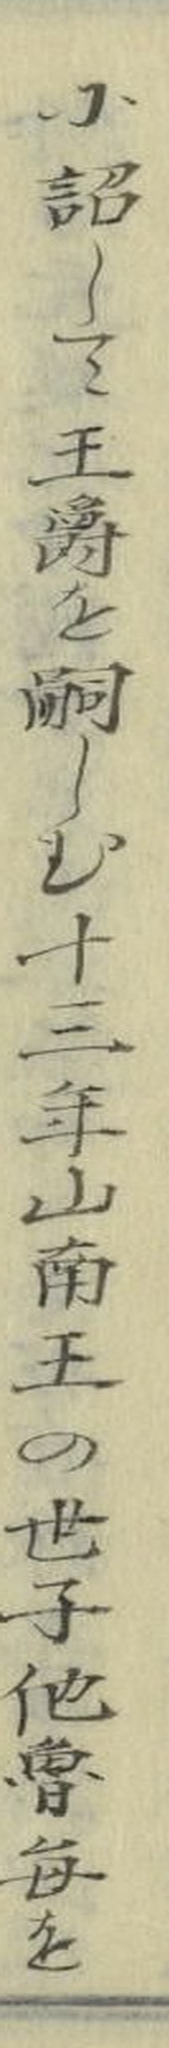に詔して王爵を嗣しむ十三年山南王の世子他魯毎を
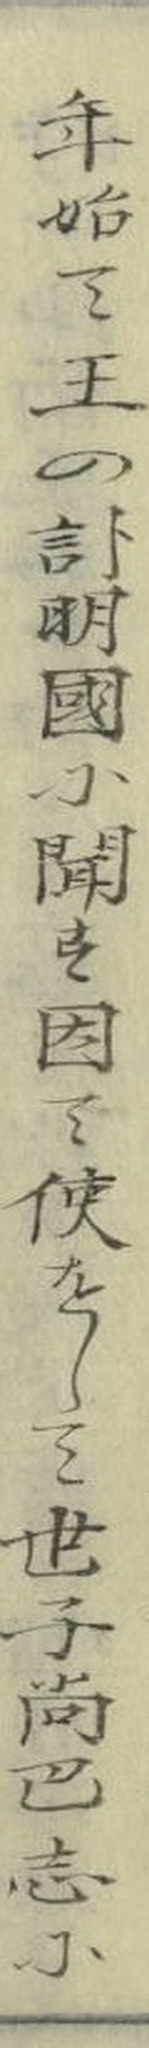年始て王の訃明国に聞す因て使をして世子尚巴志に
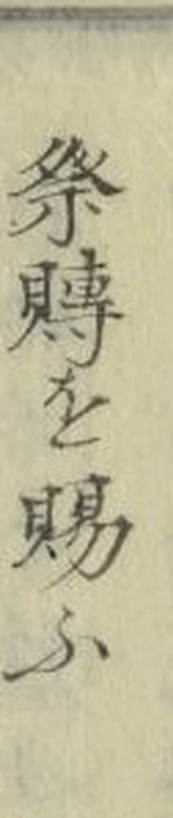祭賻を賜ふ
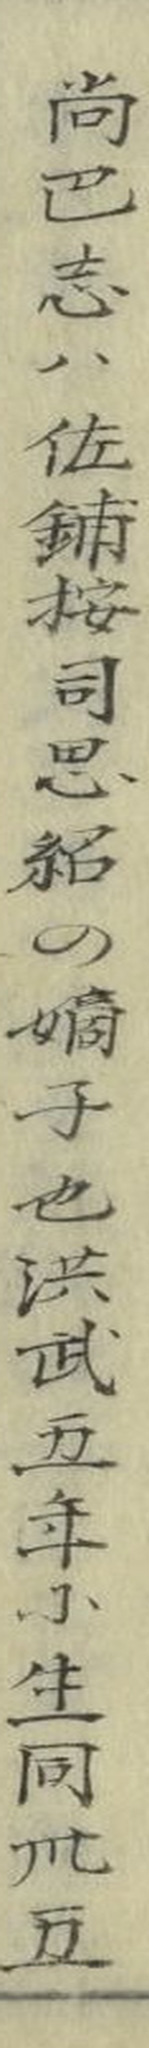尚巴志は佐鋪按司思紹の嫡子也洪武五年に生同卅五

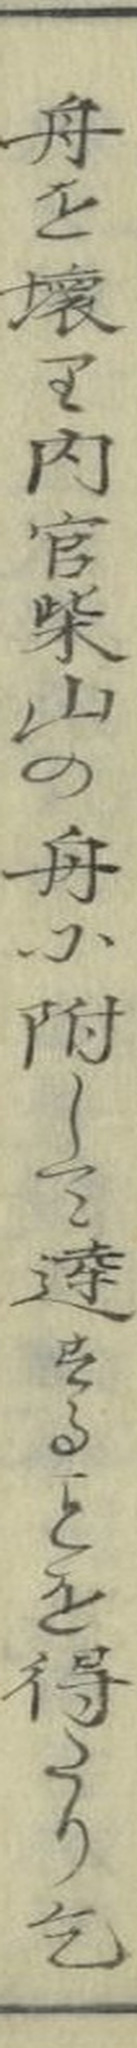舟を壊り内官柴山の舟に附して達することを得たり乞
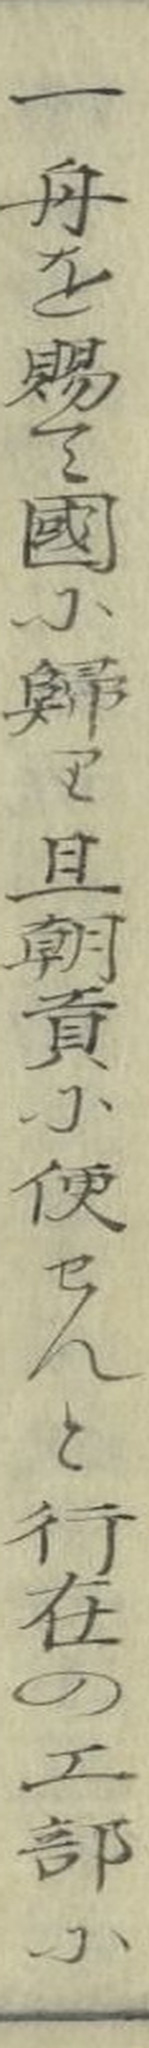一舟を賜て国に帰り且朝貢に使せんと行在の工部に
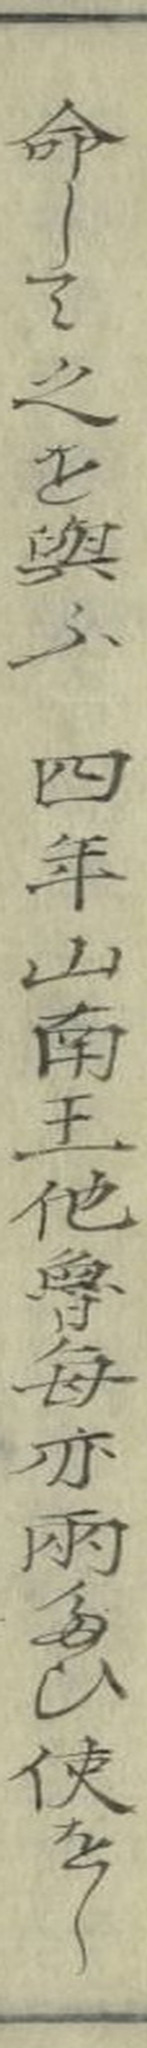命して之を与ふ四年山南王他魯毎亦両たひ使をし
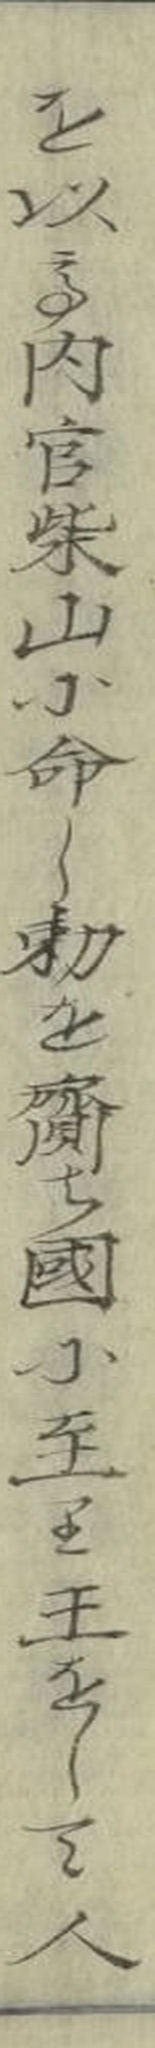を以て内官柴山に命し勅を齎て国に至り王をして人
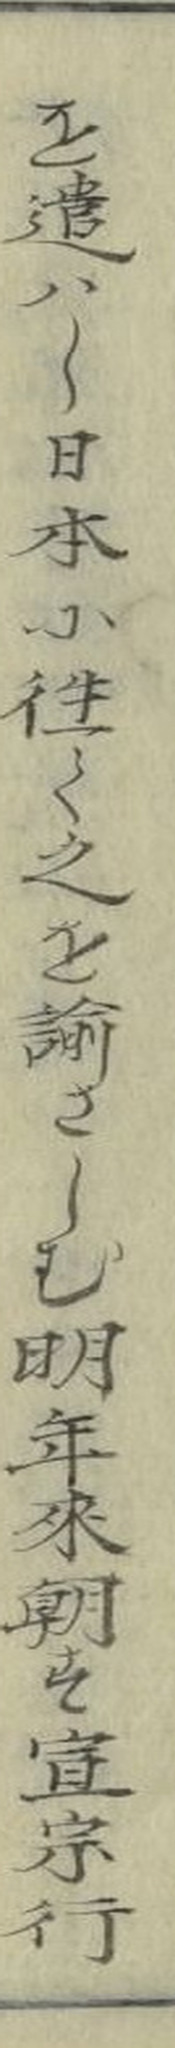を遣はし日本に往て之を諭さしむ明年来朝す宣宗行
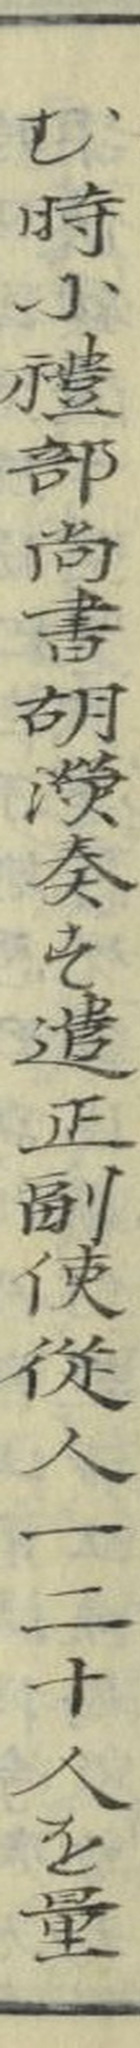む時に礼部尚書胡濙奏す遣正副使従人一二十人を量
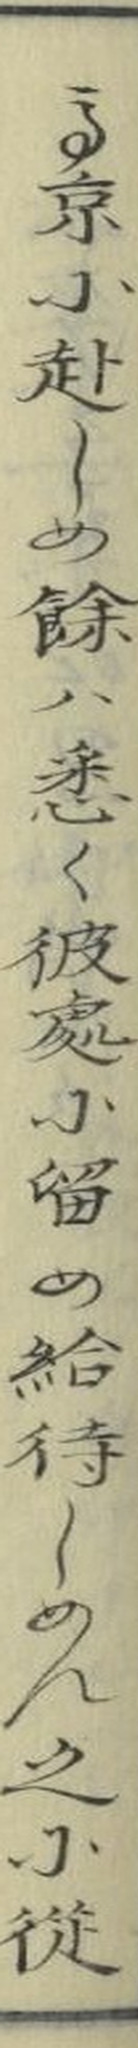て京に赴しめ餘は悉く彼処に留め給待しめん之に従
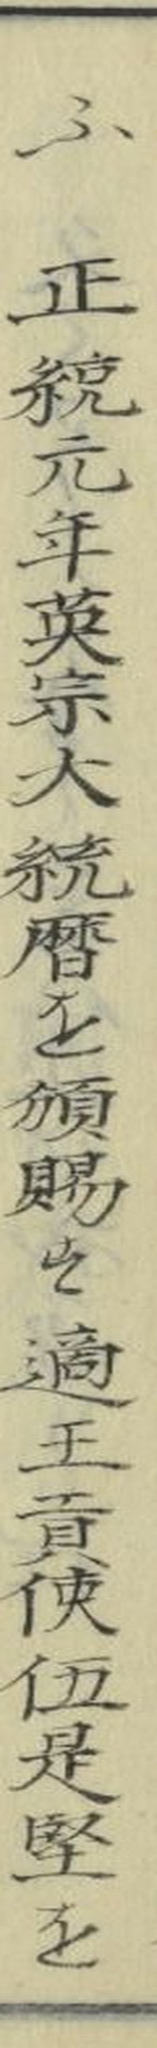ふ正統元年英宗大統暦を頒賜す適王貢使伍是堅を
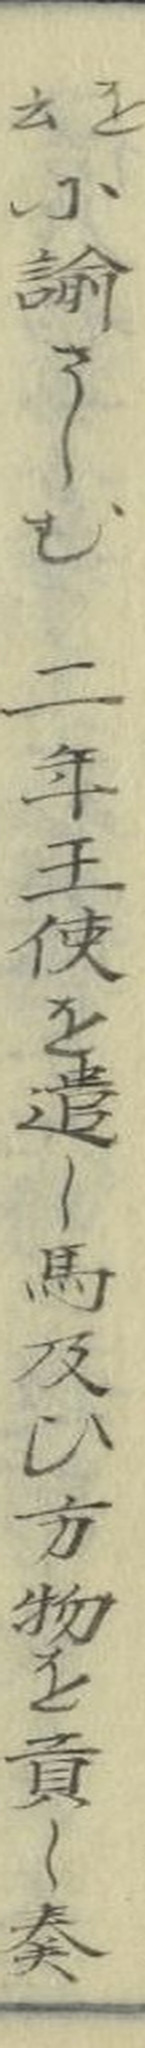を云に諭さしむ二年王使を遣し馬及ひ方物を貢し奏
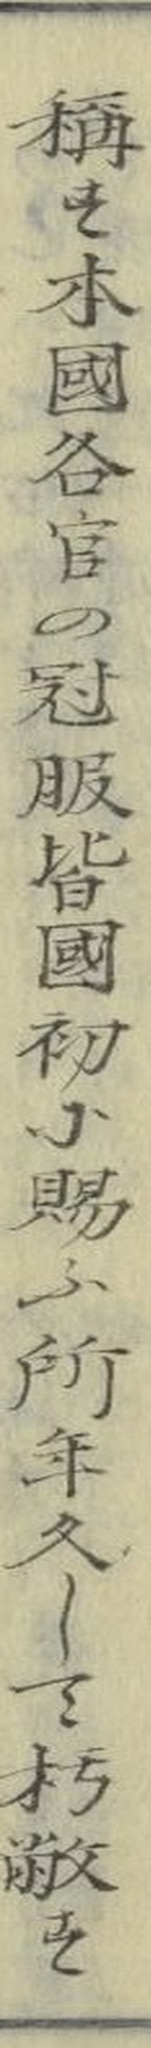称す本国各官の冠服皆国初に賜ふ所年久して杇敝す
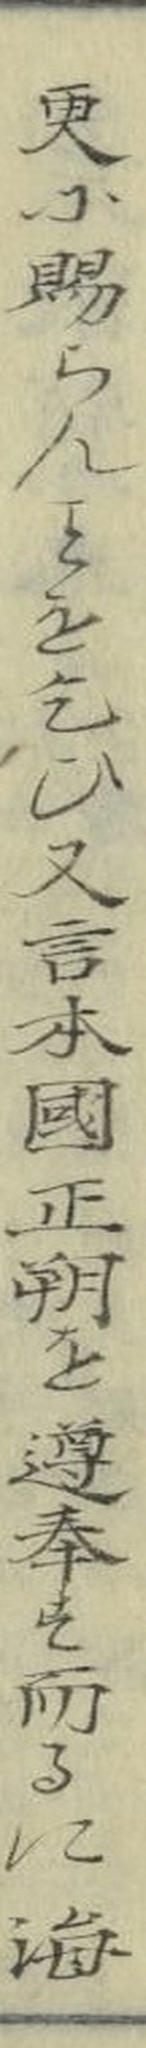更に賜らんことを乞ひ又言本国正朔を遵奉す而るに海
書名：琉球沿革志 下
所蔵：University of the Ryukyus Library
